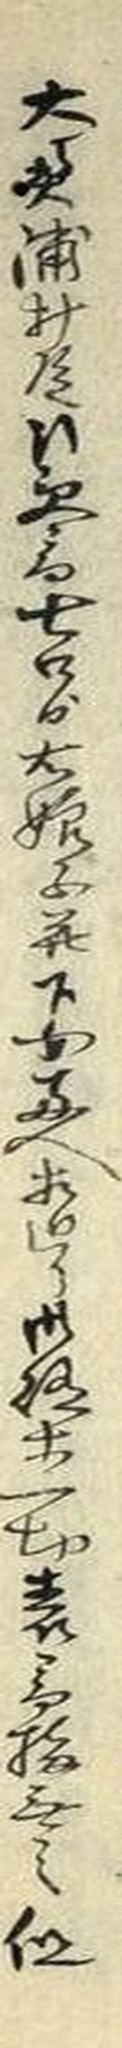大奥浦井殿引受ニ而七口ゟ右娘子幷下女両人相廻り御賄等一切表ニ而構無之但
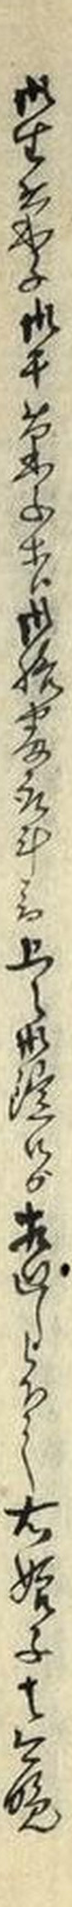御生菓子御干菓子等ハ御膳番取計ニ而上之御錠口ゟ相廻し被下之右娘子者今晩
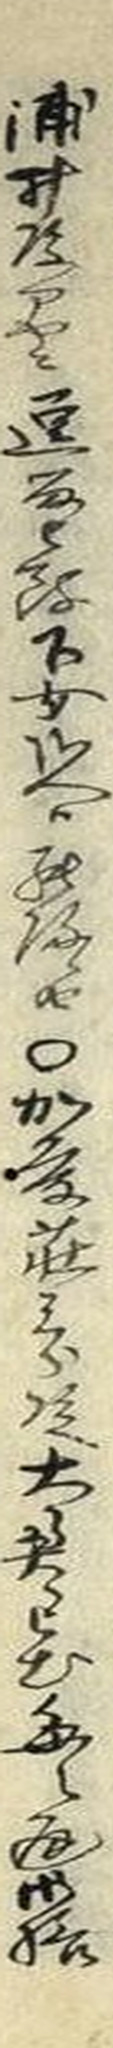浦井殿部屋ニ逗留被致下女弐人ハ罷帰候由〇加藤荘三郎殿大奥へ被出毎之通御膳
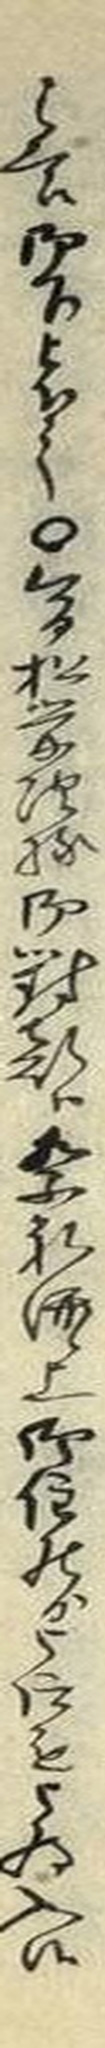之節御下被下之〇今日松栄院様御対顔ハ祭礼済候上御住居ゟ被仰進被為入候
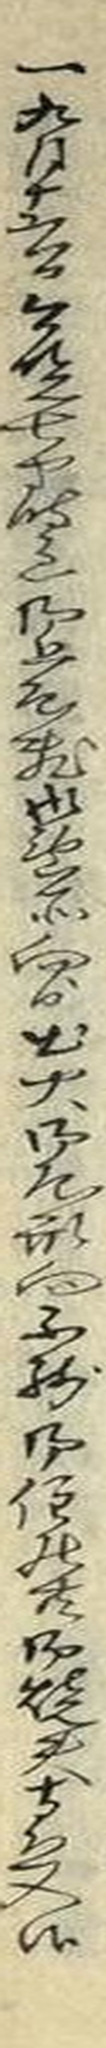一九月十六日今晩七半時過御上屋敷御台所向ゟ出火御屋形向不残御住居共御焼失奉恐入候
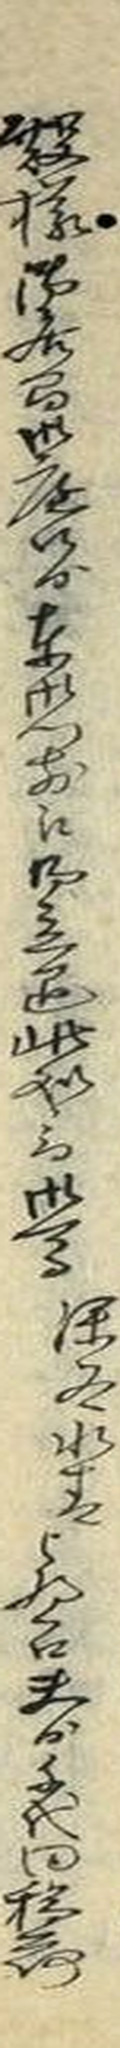殿様御居間御庭口ゟ東御門前江御立退此処ニ而御馬深谷水青被為召夫ゟ千代田稲荷

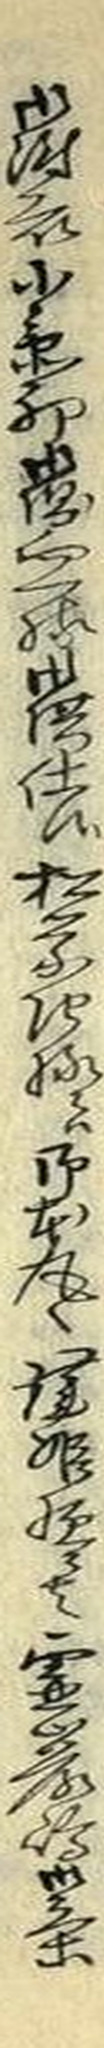御附衆小兵衛初御側向一統御供仕候松栄院様ニハ御本丸へ謹姫様ニ者霊厳嶋御茶
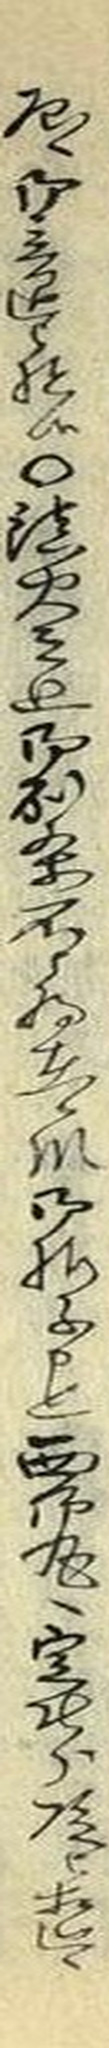屋へ御立退被遊候〇鎮火之上御別条不被為在候段御様子申上西御丸へ定次郎殿被相廻候
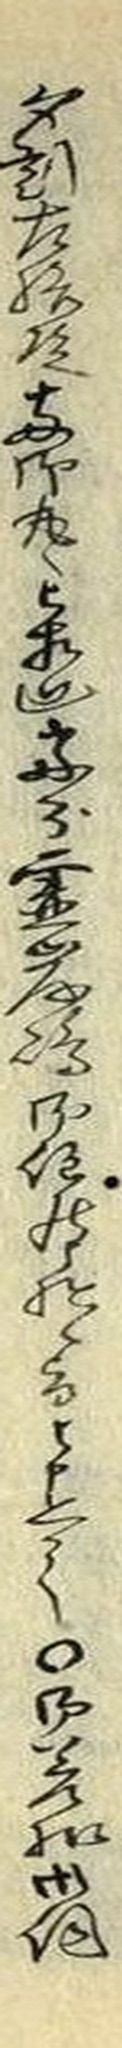夕刻左膳殿両御丸へ被相廻当分霊厳嶋御住居被遊候旨被申上之〇御差控御伺
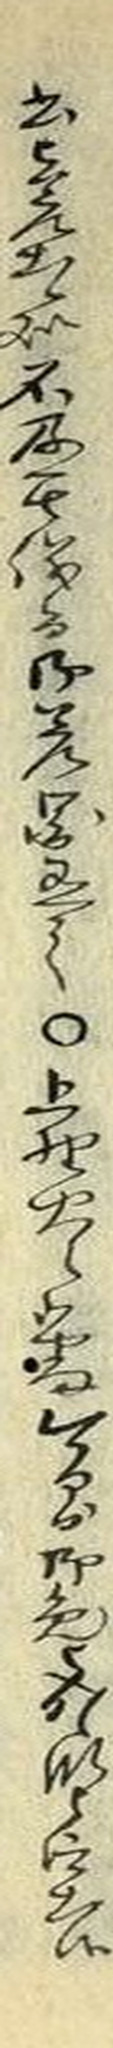書被差出候処不及其儀旨御差図有之〇上野火之番今日ゟ御免被成候段被仰出候
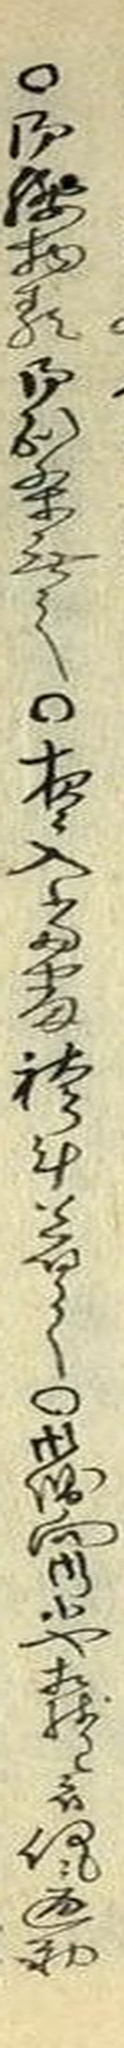〇御腰物類御別条無之〇夜ニ入当番袴斗着之〇御側向御小屋相残り候ニ付何も通勤之事
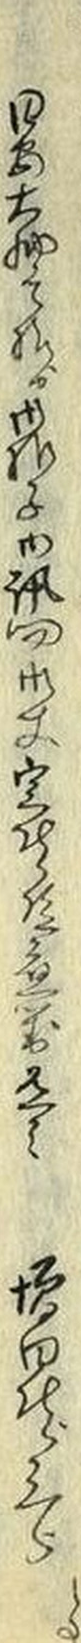田安大納言様ゟ御様子御訊問御使定次郎殿応対有之増田次郎三郎
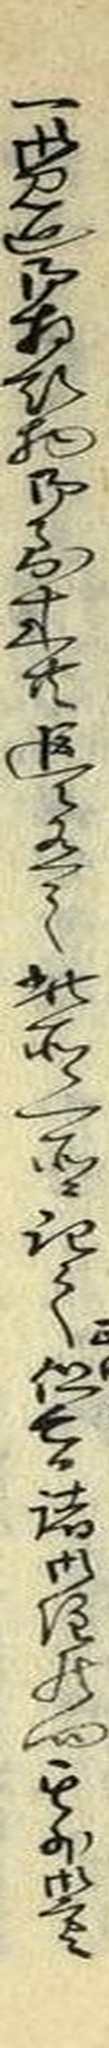一御見廻御拝領物御到来共追々有之此所へ一所ニ記之政昭言但今日諸御住居向其外御方々
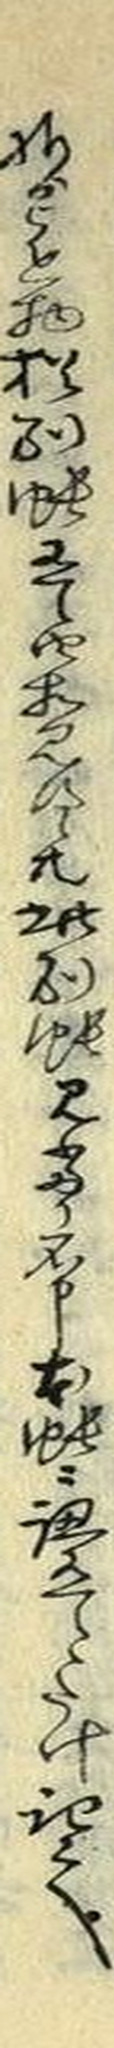様ゟ被進物猶別帳有之由相見候得共此別帳見当り不申本帳ニ認有之候たけ記之
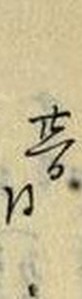廿九日
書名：少傅日録抄（斉善付側向頭取日記、在府）
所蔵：福井県文書館 Fukui Prefectural Archives
